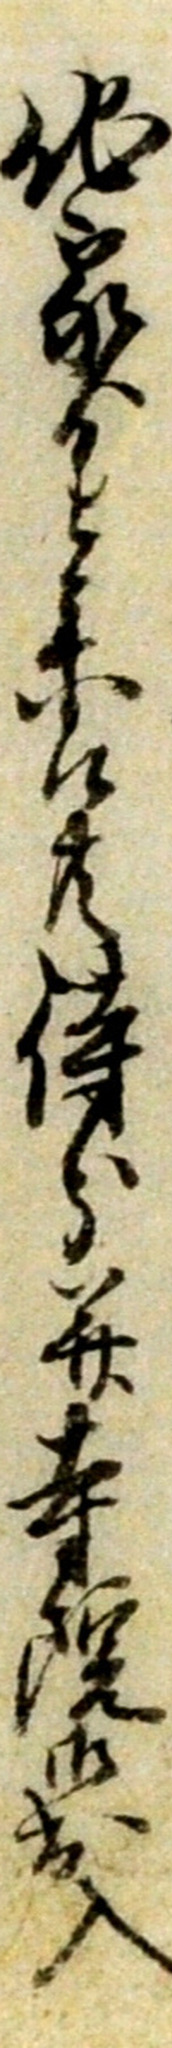他家ゟ被参候共侍分并寺院御出入
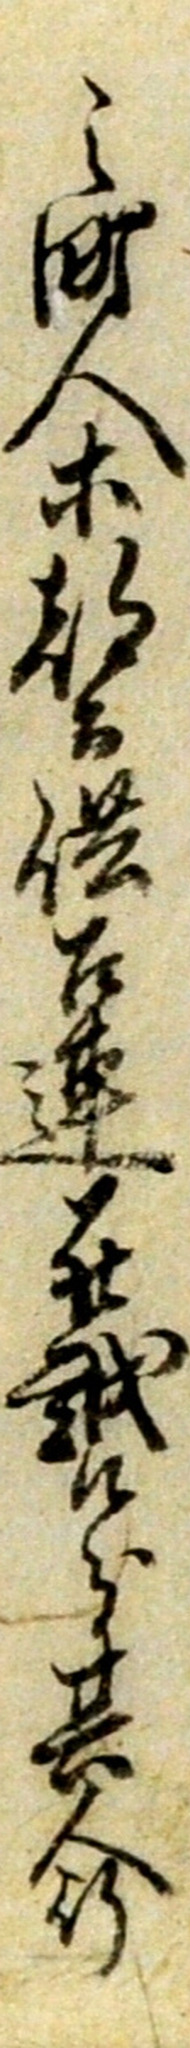之町人等都而供召連罷越候分其人行
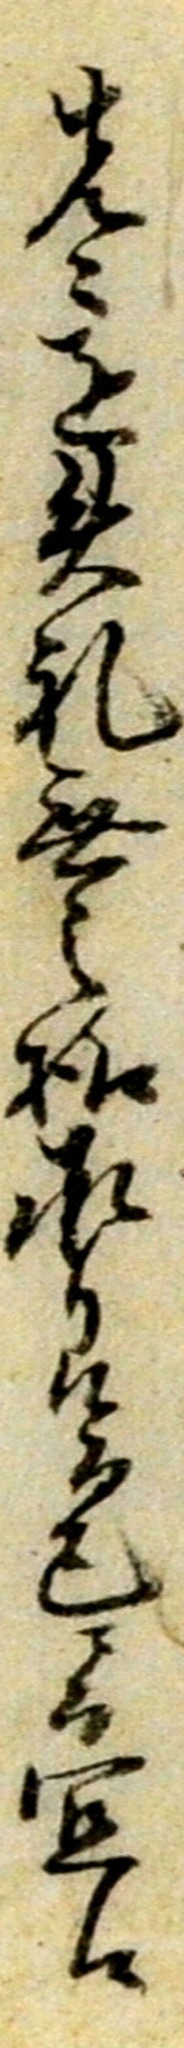先々を失礼無之様承り候而己ニ而宜ル
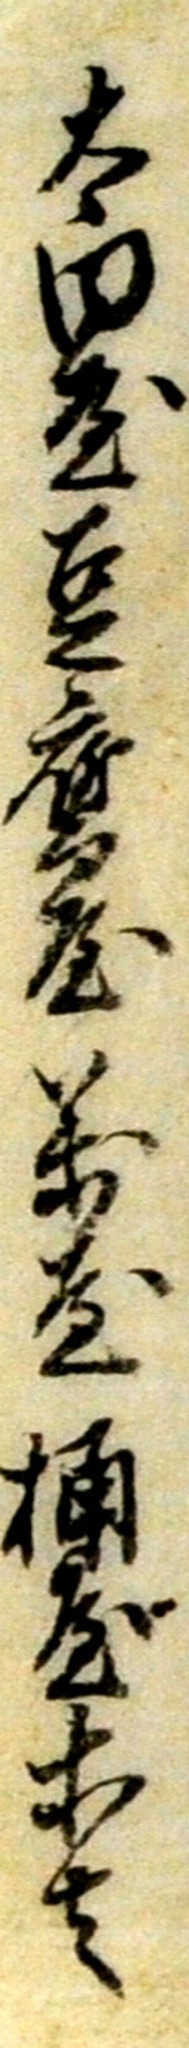太田屋豆腐屋茶屋桶屋等者

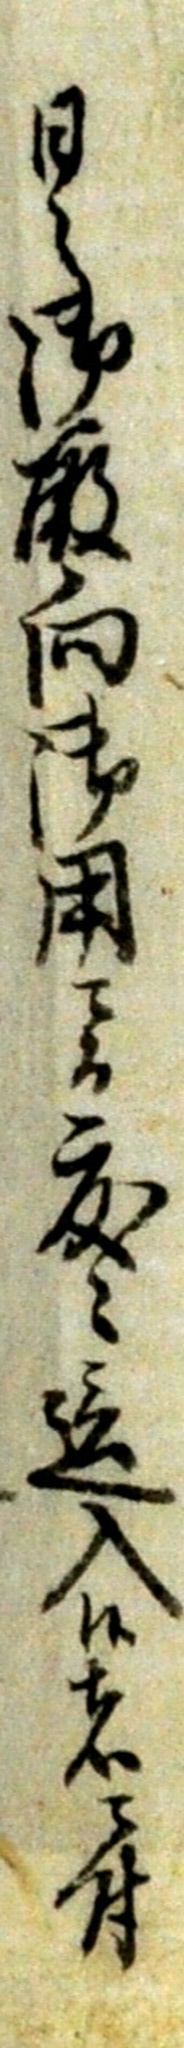日々御殿向御用ニ而度々這入候者ニ付
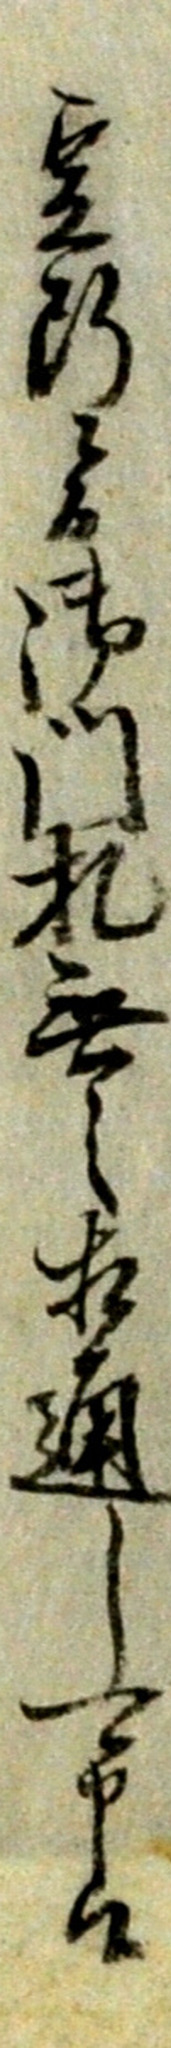定断ニ而御門札無之相通し可申候
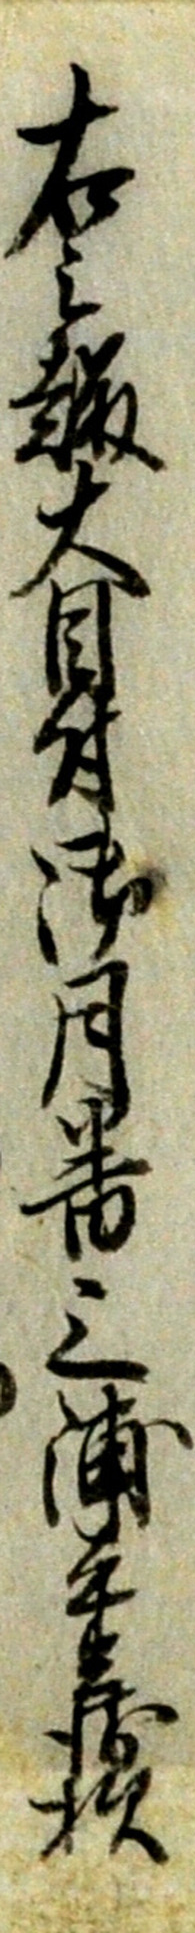右之趣大目付御月番三浦半兵衛様
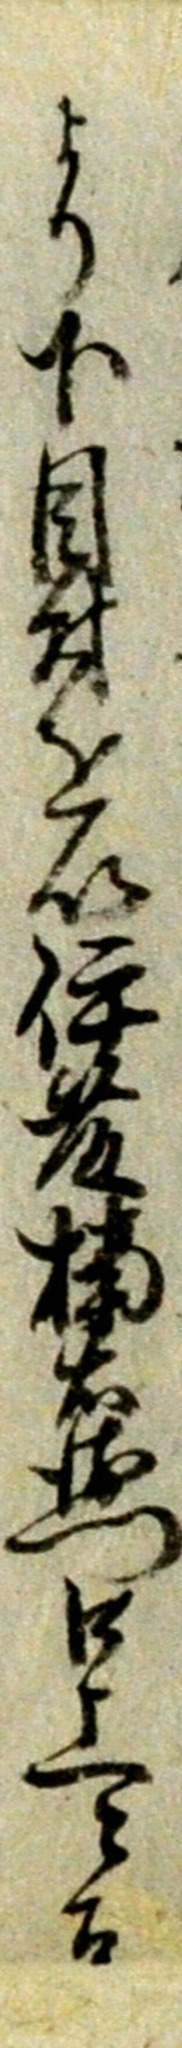より下目付を以伊藤楠右衛門向上ニ而
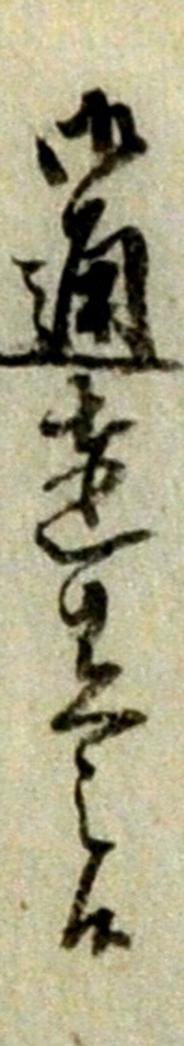御通達有之候
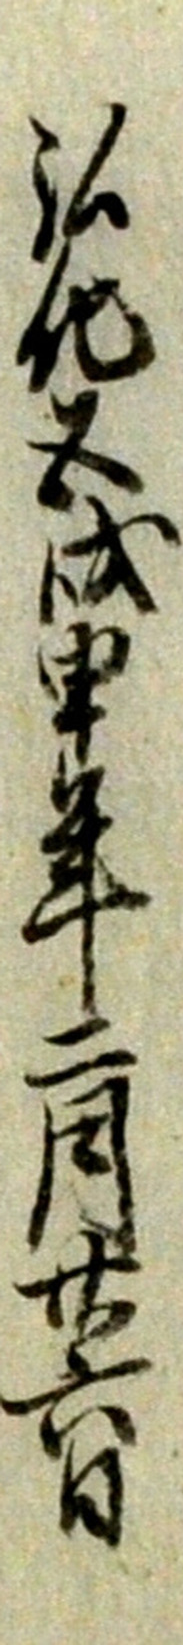弘化五戊申年二月廿六日

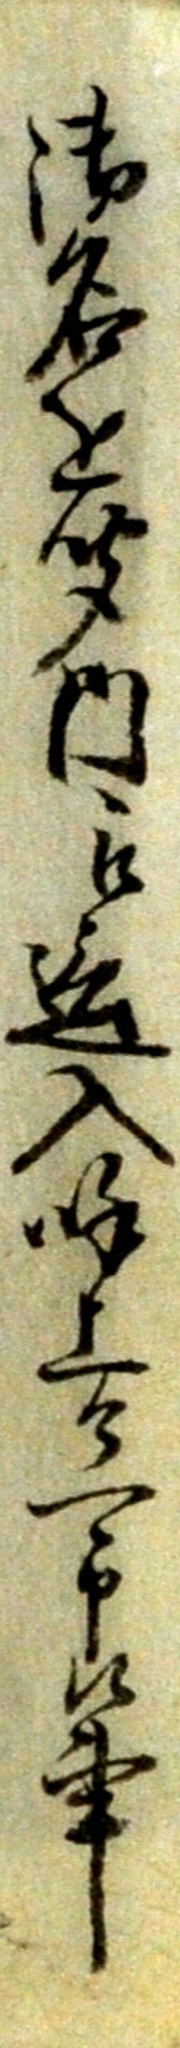御名を聞門江這入呼上ケ可申候事
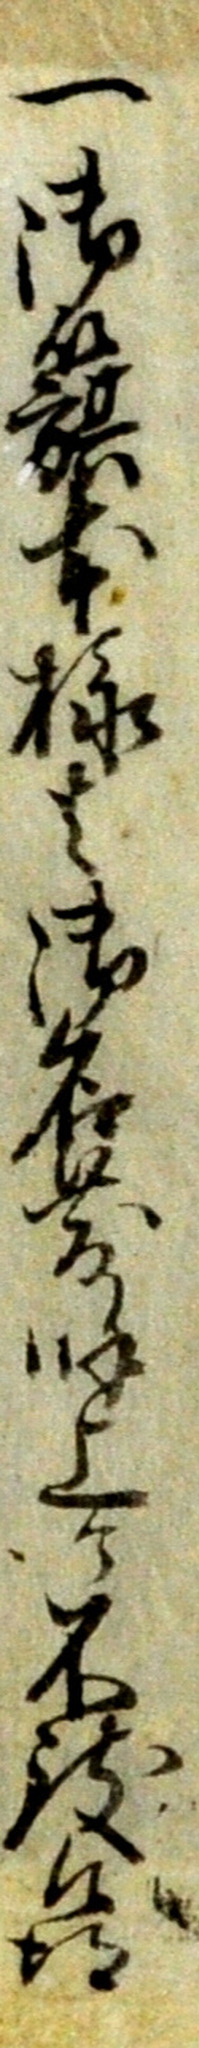一御籏本様者御名前呼上ケ不致候得
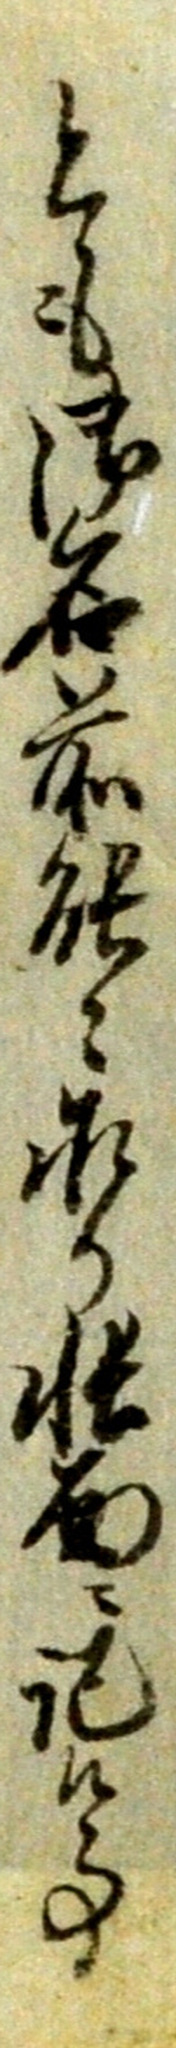とも御名前能々承り帳面ニ記候事
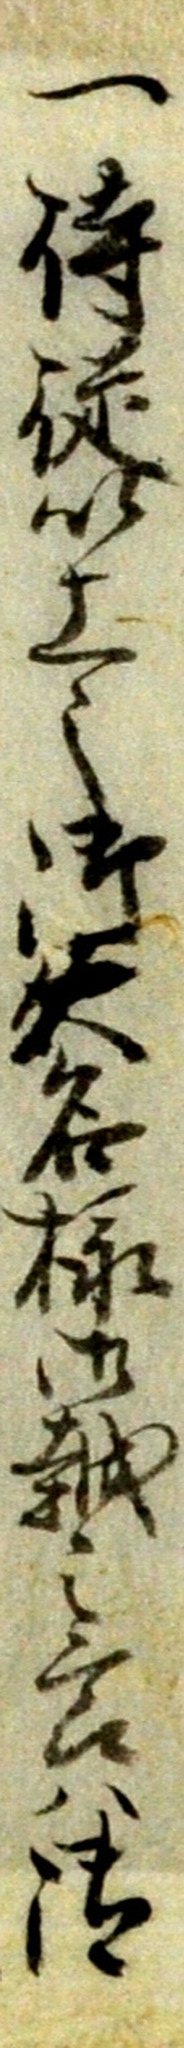一侍従以上之御大名様御越之節ハ御
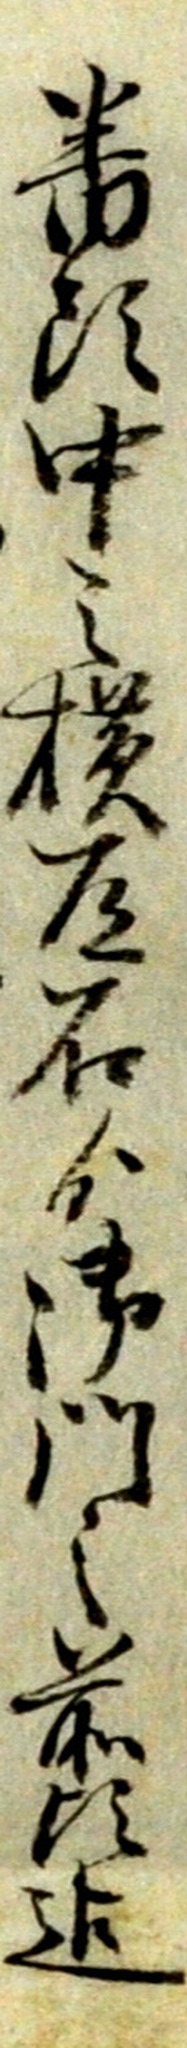番頭中之横道石ゟ御門之前頃迄
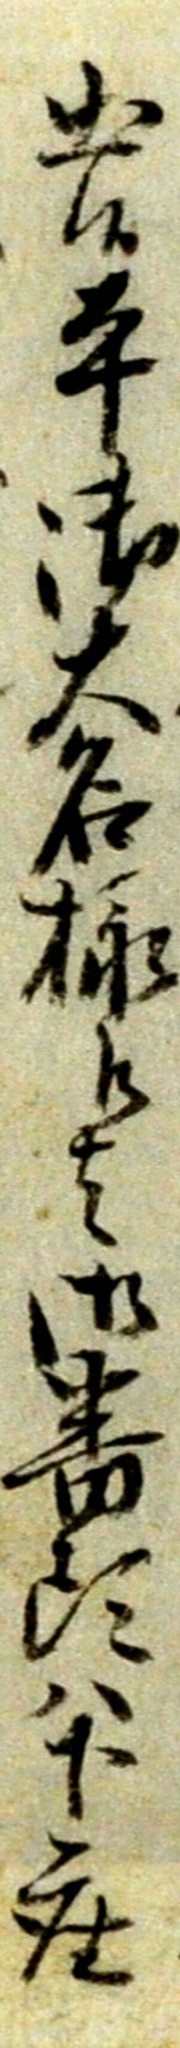出候平御大名様江者御番頭ハ下座
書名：御先手組江戸御屋敷御門番勤方
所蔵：伊那市立高遠町図書館・合同会社AMANE
